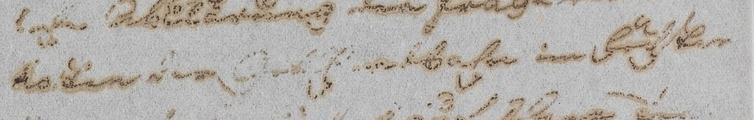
kosten der Gotthardbahn im höchsten
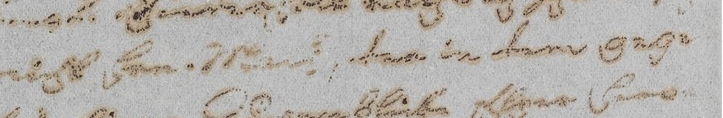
nicht Hrn. M..., der in dem gegen-
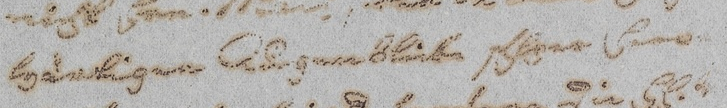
wärtigen Augenblicke schwer heran-
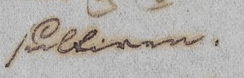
sultiren.
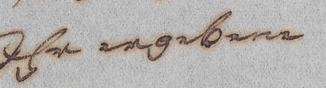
Ihr ergebene
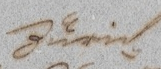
Zürich
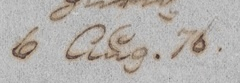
6 Aug. 76.
